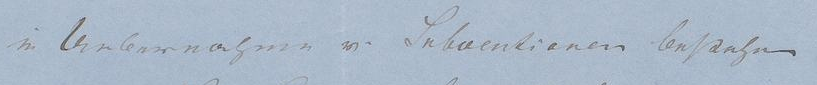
in Uebernahme v. Subventionen bestehen
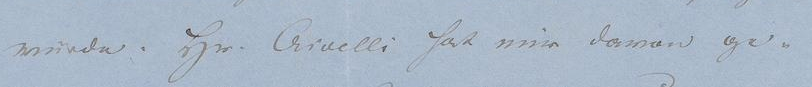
würden. Hr. Crivelli hat mir davon ge-
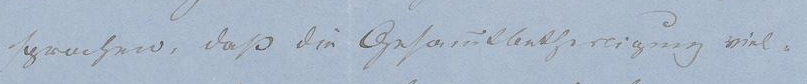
sprochen, daß die Gesammtbetheiligung viel-
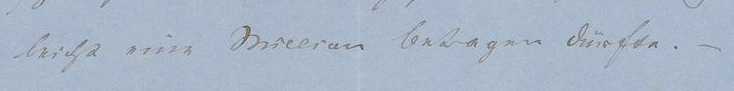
leicht eine Million betragen dürfte. –
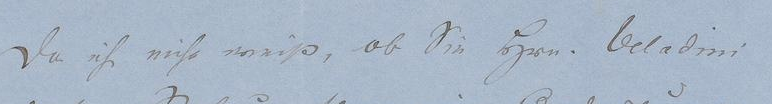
Da ich nicht weiß, ob Sie Hrn. Veladini
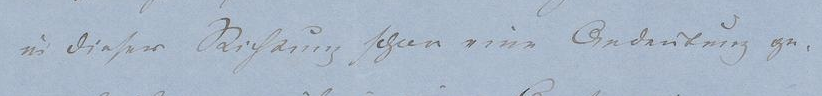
in dieser Richtung schon eine Andeutung ge-
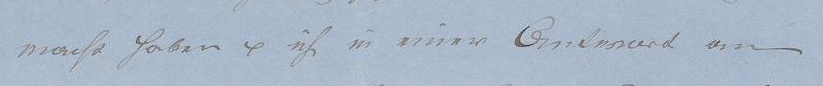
macht haben & ich in einer Antwort an
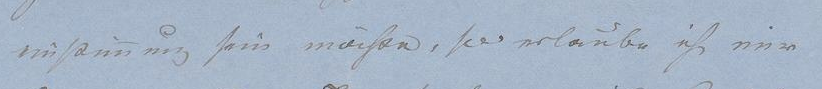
einstimmung sein möchte, so erlaube ich mir
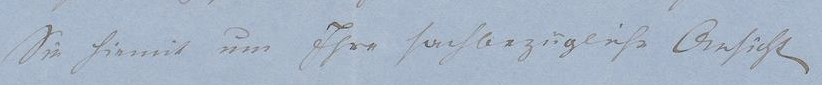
Sie hiermit um Ihre sachbezügliche Ansicht
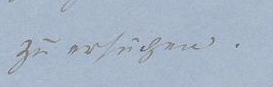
zu ersuchen.
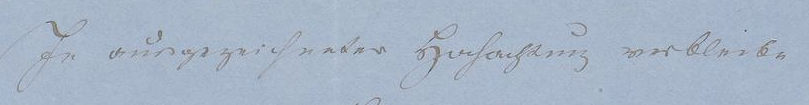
In ausgezeichneter Hochachtung verbleibe
